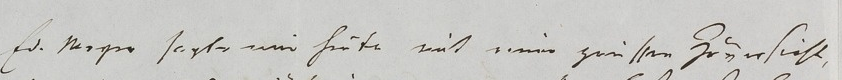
Ed. Meyer sagte mir heute mit einer gewissen Zuversicht,
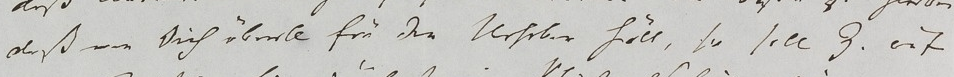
daß man Dich überall für den Urheber hält, so soll Z. auf
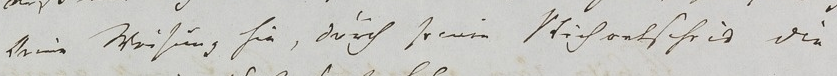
Deine Weisung hin, durch seinen Stichentscheid die
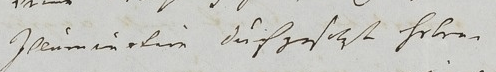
Illumination durchgesetzt haben.
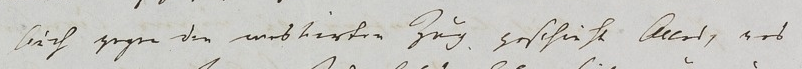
Auch gegen den maskirten Zug geschieht Alles, was
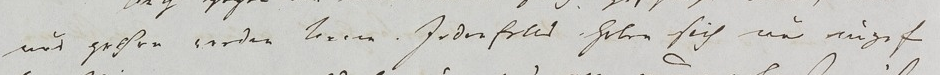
nur gethan werden kann. Jedenfalls haben sich nur ungef
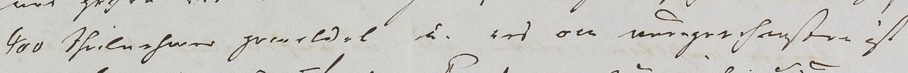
400 Theilnehmer gemeldet u. was am unangenehmsten ist
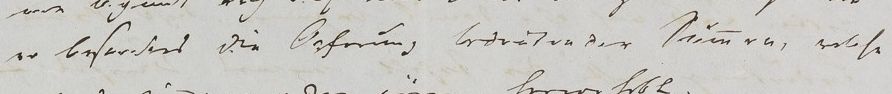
wo besonders die Opferung bedeutender Summen, welche
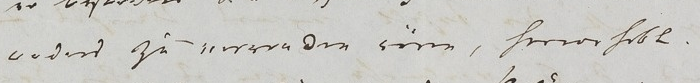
anders zu verwenden wären, hervorhebt.
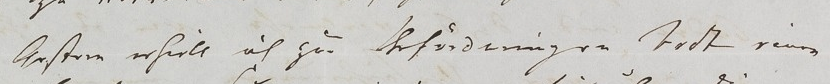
Gestern erhielt ich zu Beförderung an Todt einen
